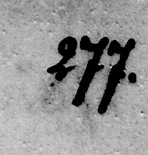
13926.
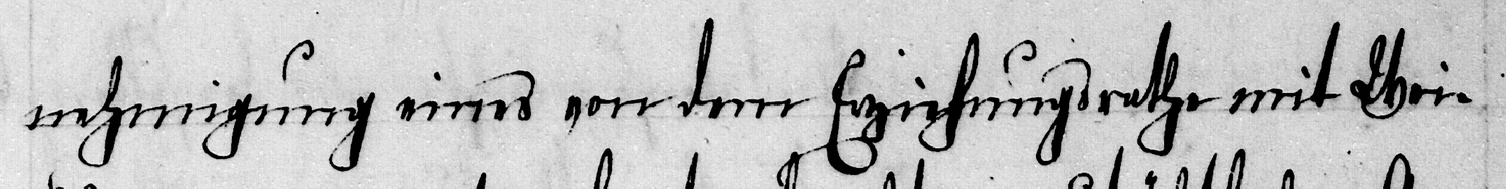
nehmigung eines von dem Erziehungsrathe mit Wei¬
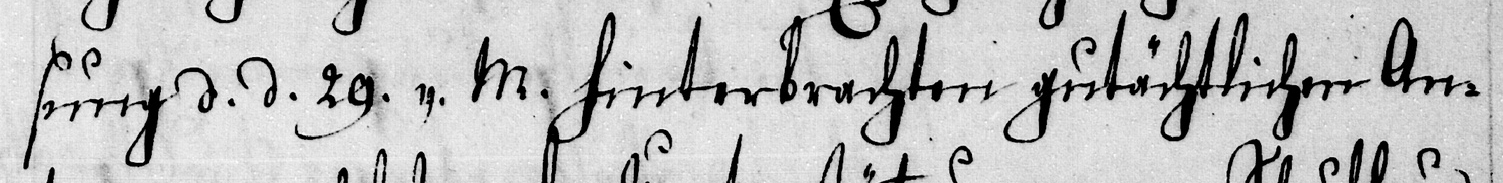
sung d. d. 29. v. M. hinterbrachten gutächtlichen An¬
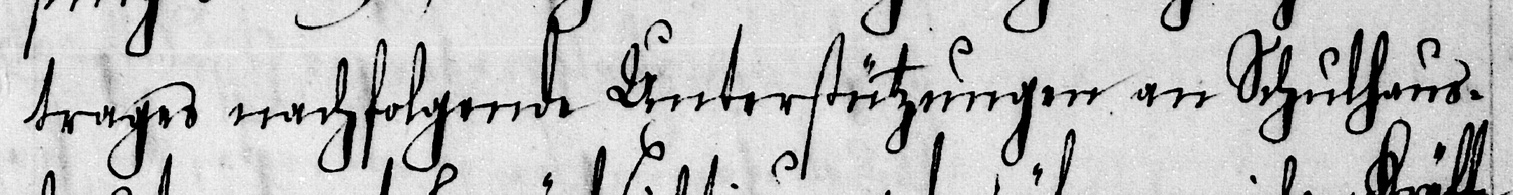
trages nachfolgende Unterstützungen an Schulhaus¬
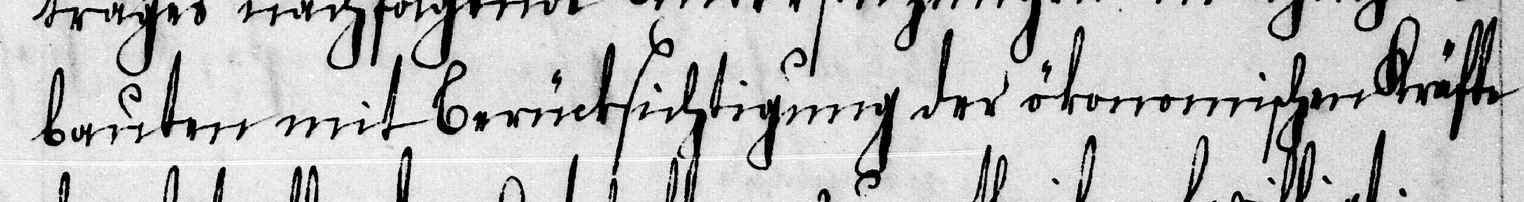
bauten mit Berücksichtigung der ökonomischen Kräfte
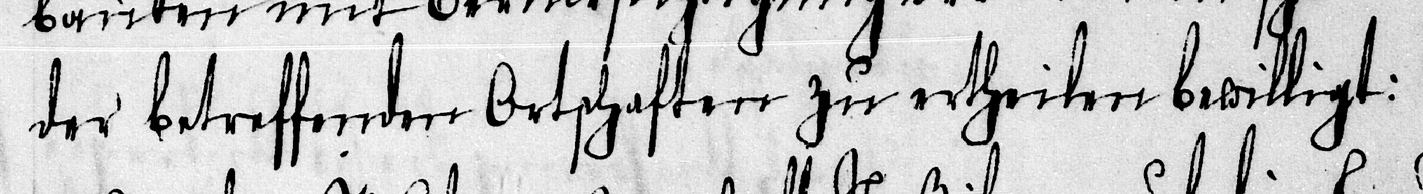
der betreffenden Ortschaften zu ertheilen bewilligt:
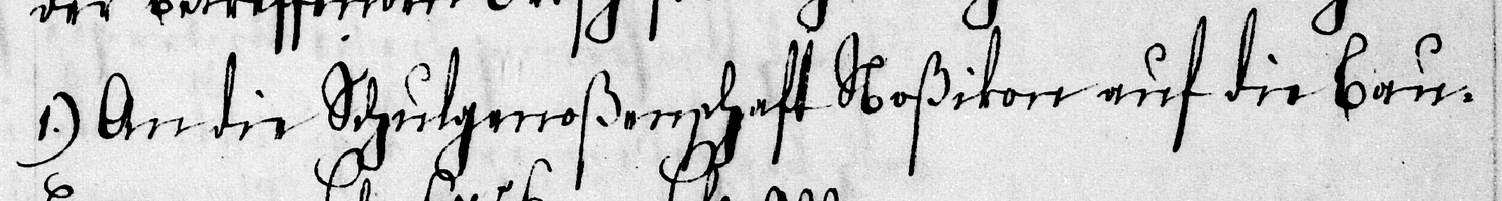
1.) An die Schulgenoßenschaft Noßikon auf die Bau¬
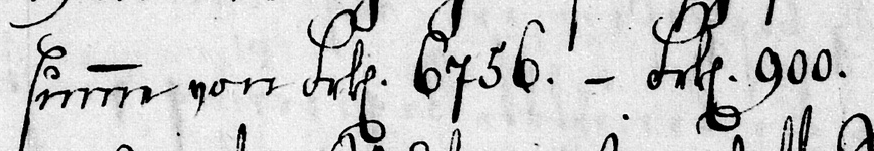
summe von Frk[en]. 6756. – Frk[en]. 900.
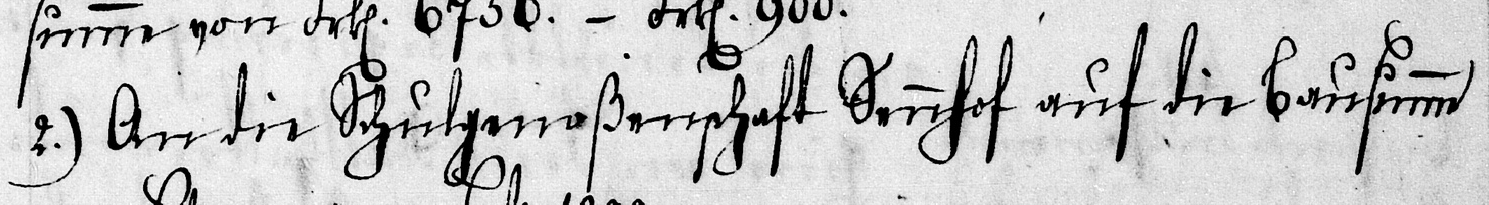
2.) An die Schulgenoßenschaft Sennhof auf die Bausumme
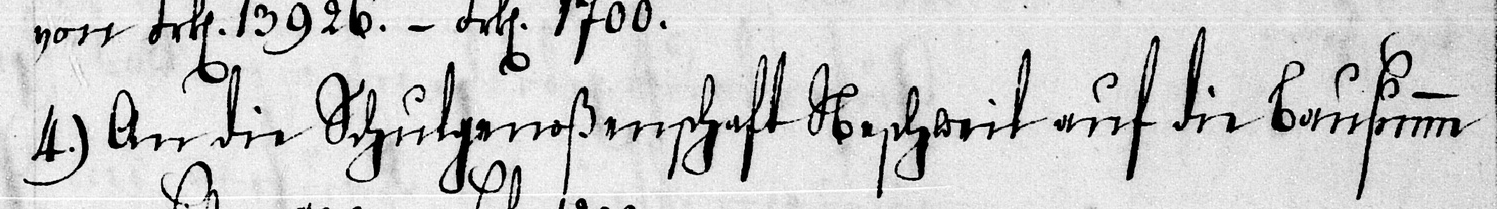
4.) An die Schulgenoßenschaft Neschweil auf die Bausumme
